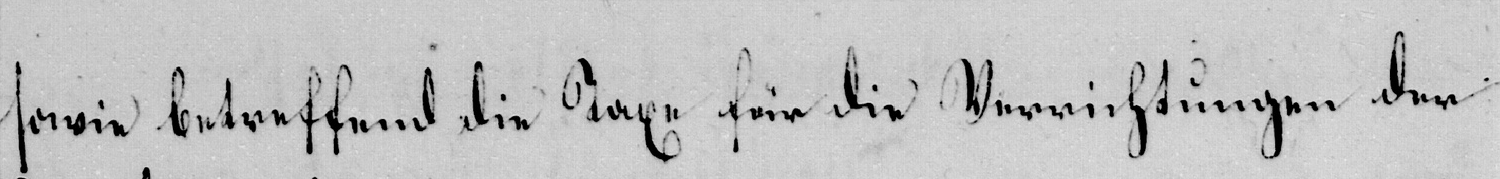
sowie betreffend die Taxe für die Verrichtungen der
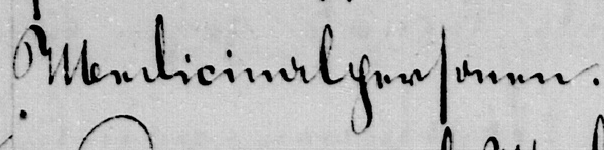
Medicinalpersonen.
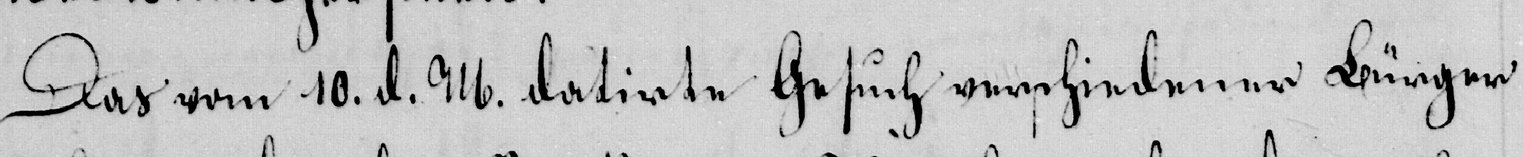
Das vom 10. d. M. datirte Gesuch verschiedener Bürger
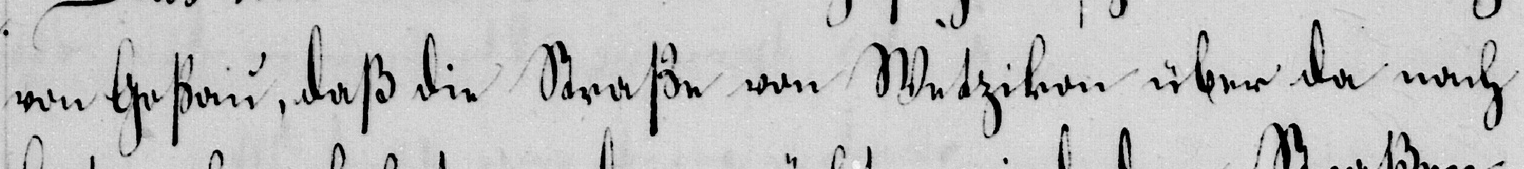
von Goßau, daß die Straße von Wetzikon über da nach
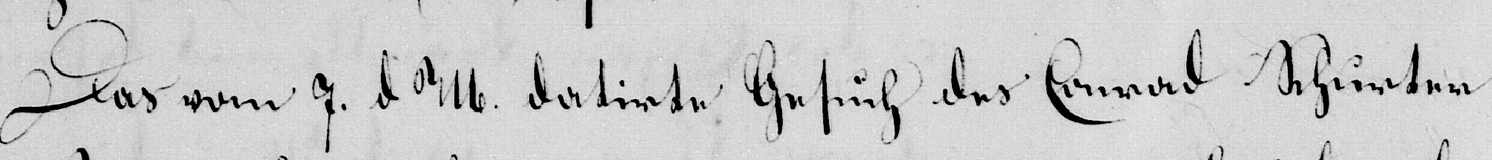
Das vom 7. d. M. datirte Gesuch des Conrad Schurter
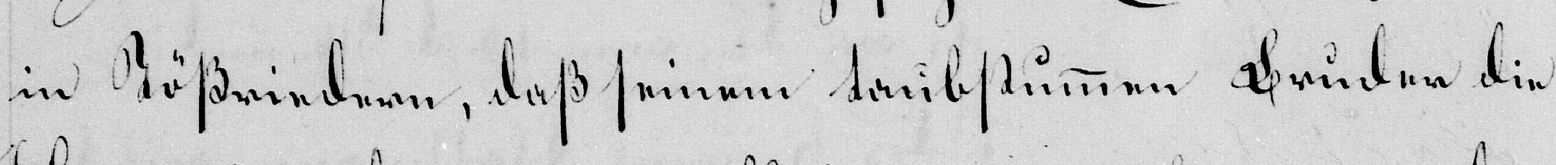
in Tößriedern, daß seinem taubstummen Bruder die
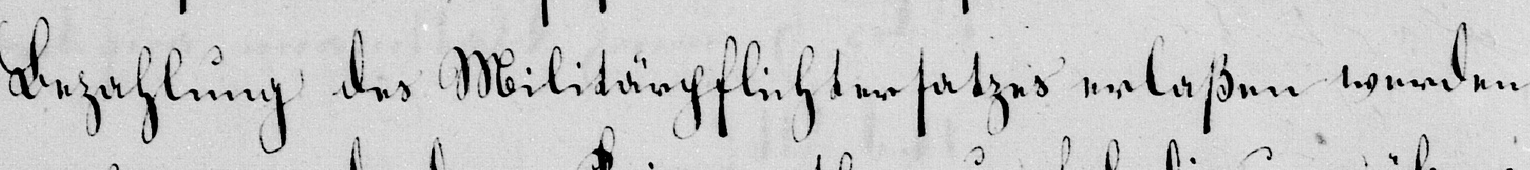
Bezahlung des Militärpflichtersatzes erlaßen werden
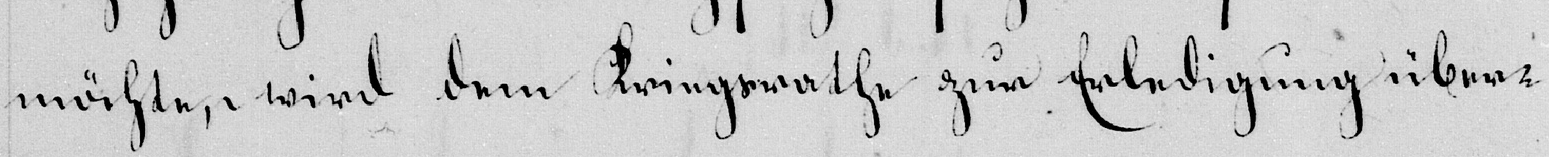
möchte, wird dem Kriegsrathe zur Erledigung über¬
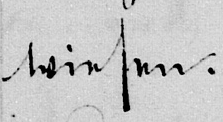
wiesen.
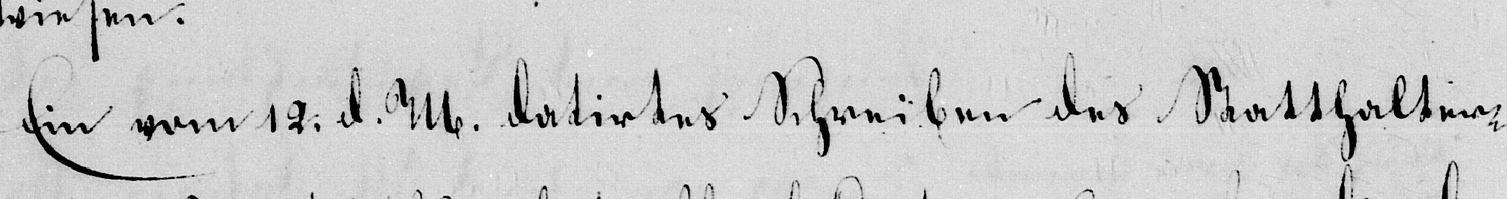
Ein vom 12. d. M. datirtes Schreiben des Statthalter¬
